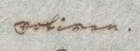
votiren.
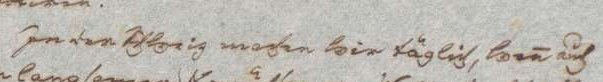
In der Schweiz machen wir täglich, wenn auch
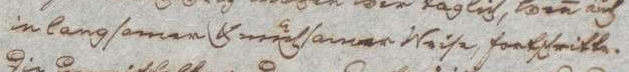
in langsamer & mühsamer Weise, Fortschritte.
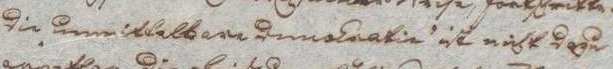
Die unmittelbare Demokratie ist nicht dazu
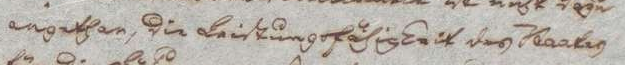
angethan, die Leistungsfähigkeit des Staates
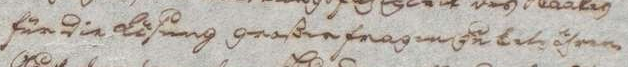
für die Lösung großer Fragen zu bewähren.
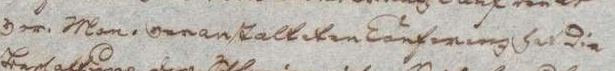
vor. Mon. veranstalteten Conferenz hat die
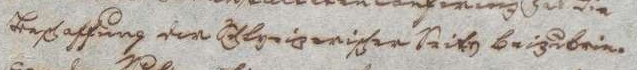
Beschaffung der Schweizerischer Seits beizubrin-
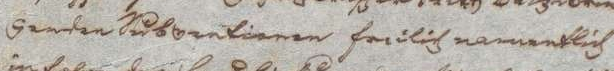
genden Subventionen freilich namentlich
